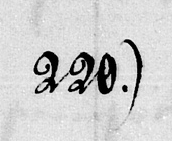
220.)
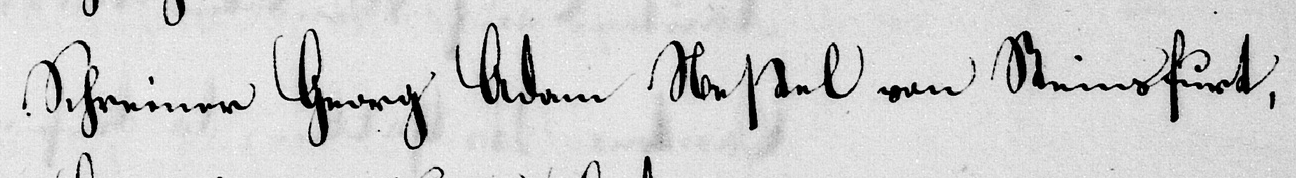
Schreiner Georg Adam Nestel von Steinsfurt,
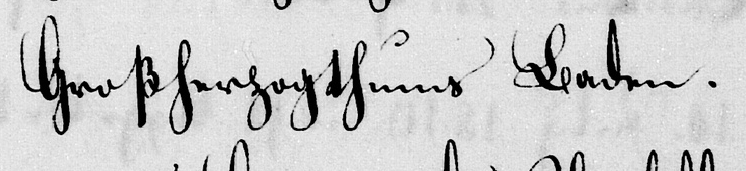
Großherzogthums Baden.
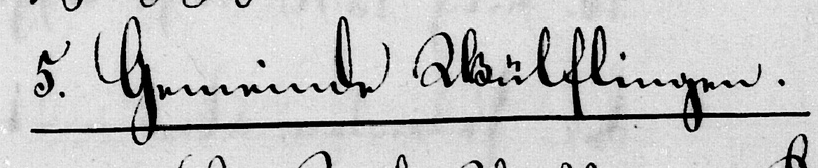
5. Gemeinde Wülflingen.
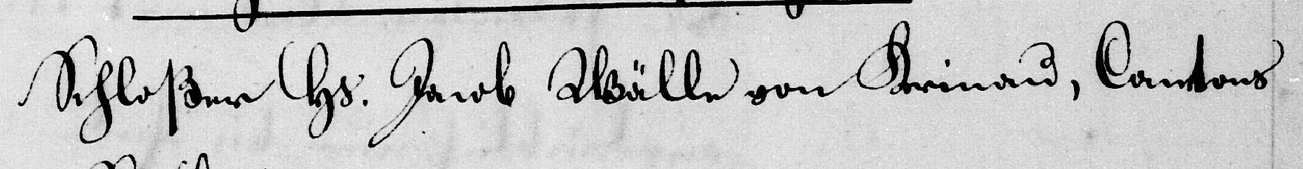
Schloßer Hs. Jacob Wälle von Kriens, Cantons
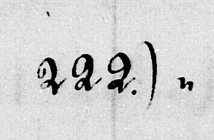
222.) “
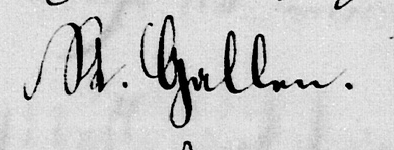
St. Gallen.
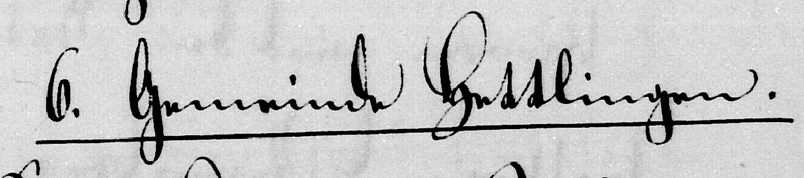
6. Gemeinde Hettlingen.
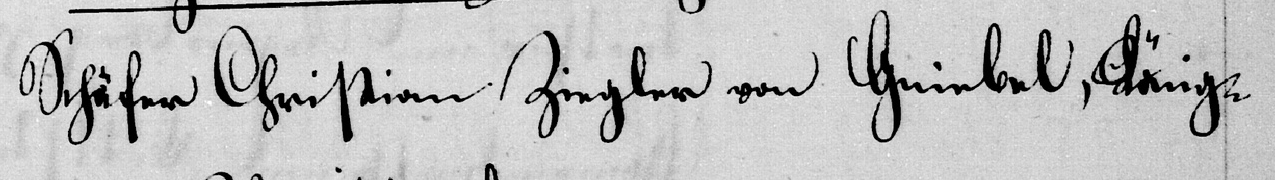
Schäfer Christian Ziegler von Gniebel, König¬
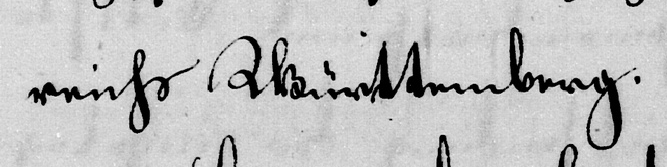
reichs Württemberg.
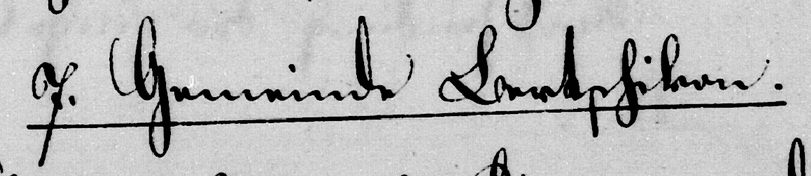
7. Gemeinde Bertschikon.
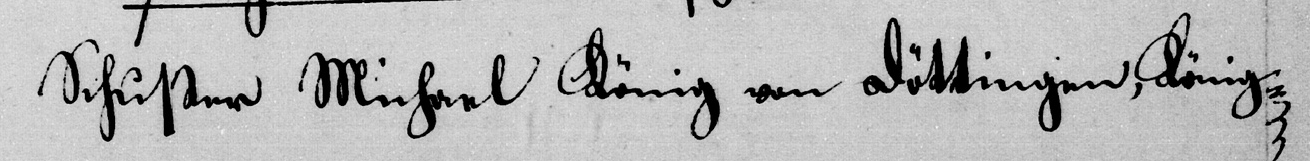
Schuster Miguel König von Döttingen, König-
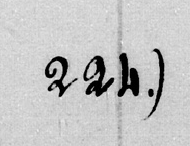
224.)
